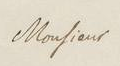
Monsieur
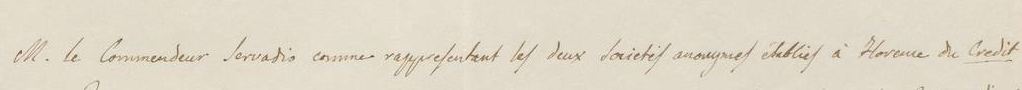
M. le Commendeur Servadio comme rappresentant les deux Societés anonymes établies à Florence du Credit
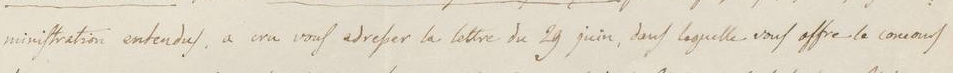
ministration entendus, a cru vous adresser la lettre du 29 juin, dans laquelle vous offre le concours
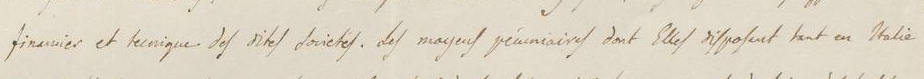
financier et tecnique des dites Societés. Les moyens pécuniaires dont Elles disposent tant en Italie
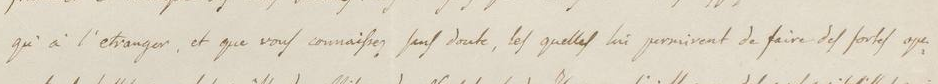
qu`à l'etranger, et que vous connaissez sans doute, les quelles lui permirent de faire des fortes ope-
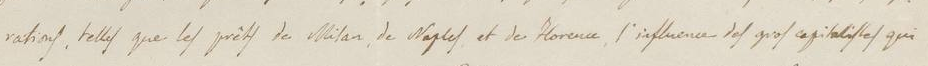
rations, telles que les prêts de Milan, de Naples, et de Florence, l'influence des gros capitalistes qui
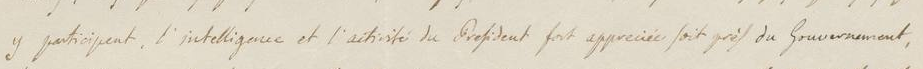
y participent, l'intelligence et l'activité du President fort appreciée soit près du Gouvernement,
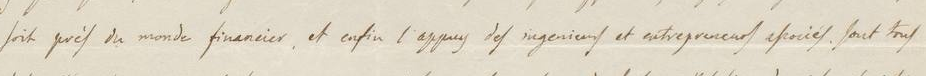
soit près du monde financier, et enfin l'appuy des ingenieurs et entrepreneurs associés, sont tous
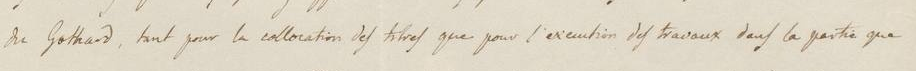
de Gothard, tant pour la collocation des titres que pour l'execution des travaux dans la partie que
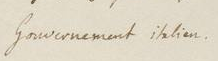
Gouvernement italien.
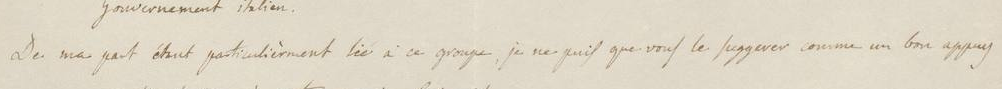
De ma part étant particulièrment lié à ce groupe, je ne puis que vous le suggerer comme un bon appuy
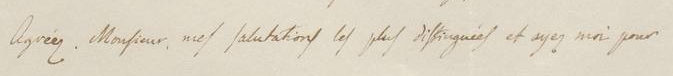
Agréez, Monsieur, mes salutations les plus distinguées et ayez moi pour
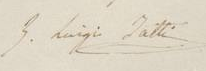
Ig. Luigi Tatti
